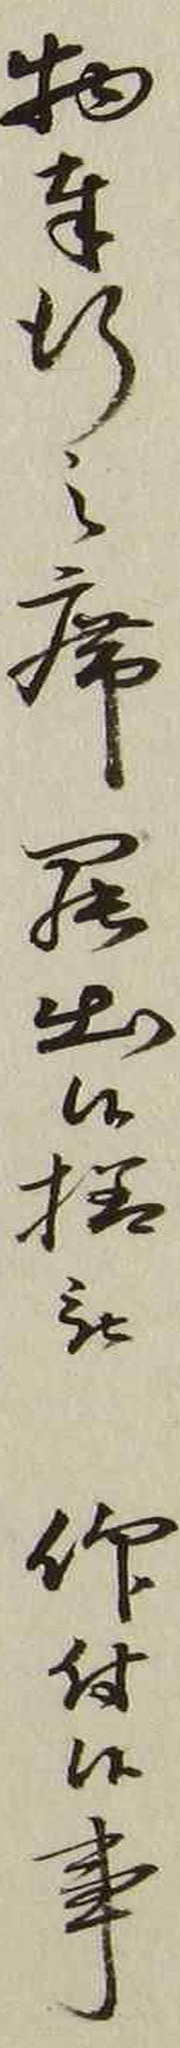物奉行之席罷出候様被仰付候事
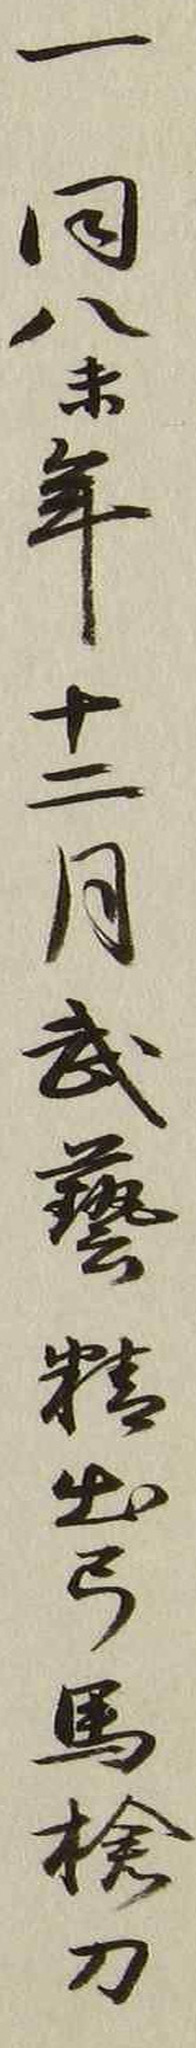一同八未年十二月武芸精出弓馬検刀
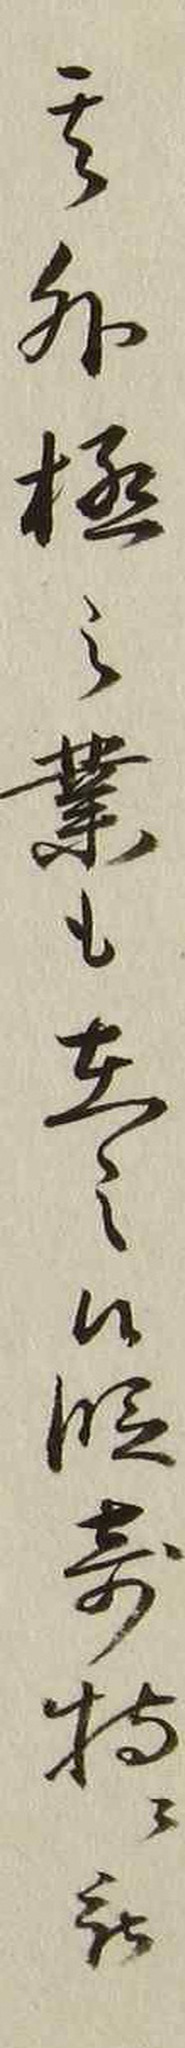其外極之業も在之候段寄持ニ候
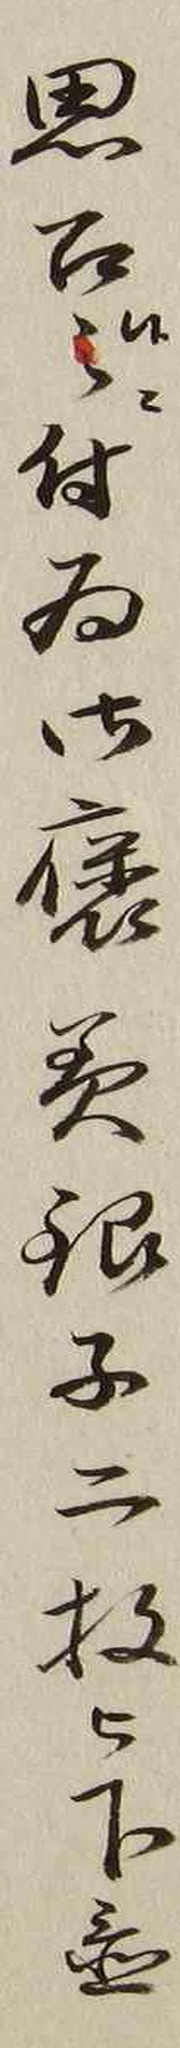思召候ニ付ゐ御褒美銀子二枚迄下置
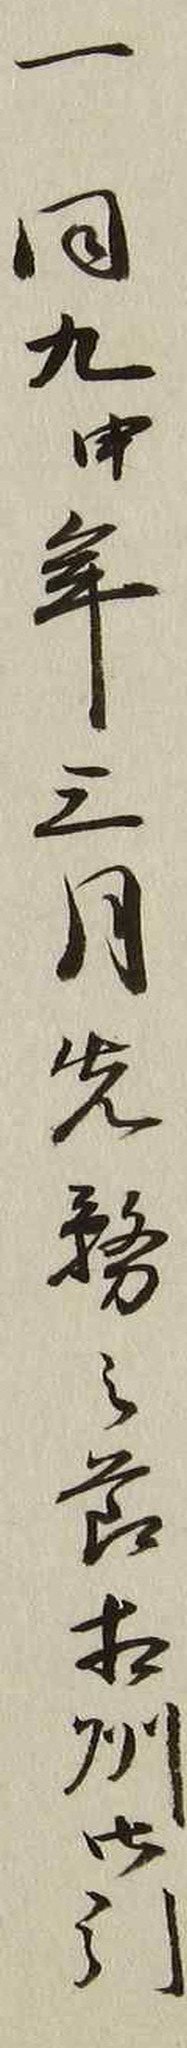一同申年三月先務之節相州御引
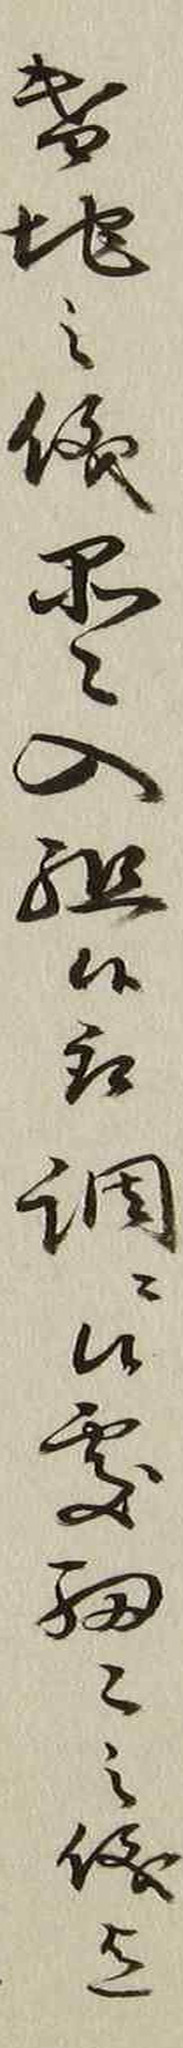け地之儀品々入組候取調ニ候処細々之儀迄
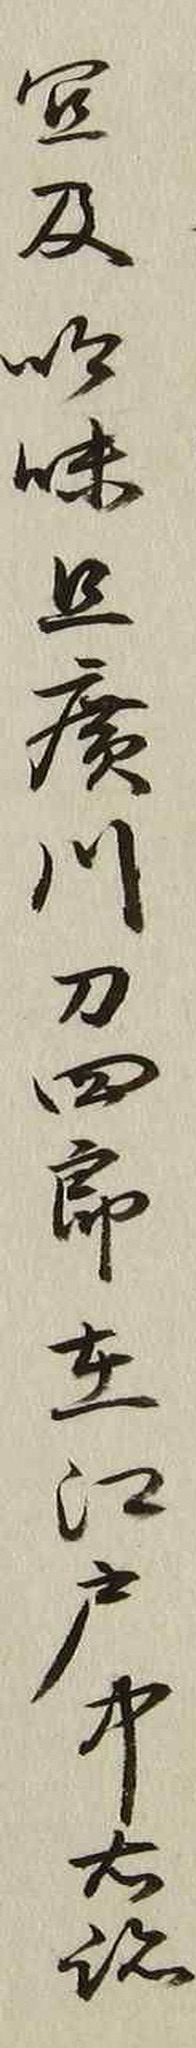宜及吟味且広川刀四郎在江戸中右跡
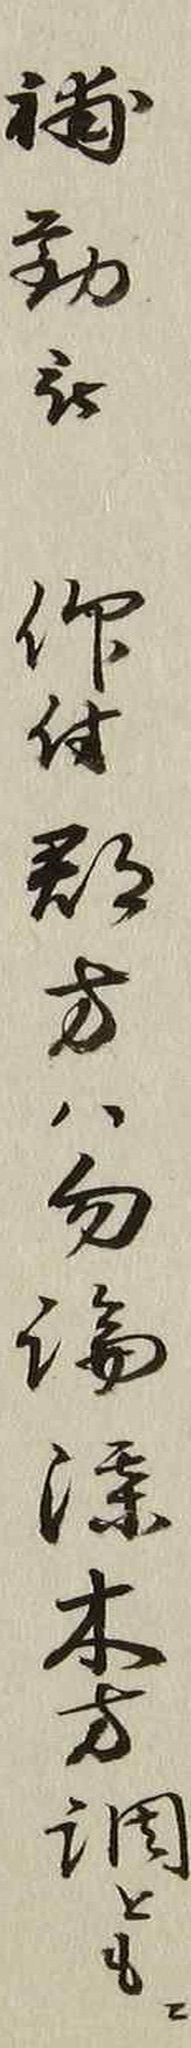補勤取仰付郡方は勿論漆木方調ともニ
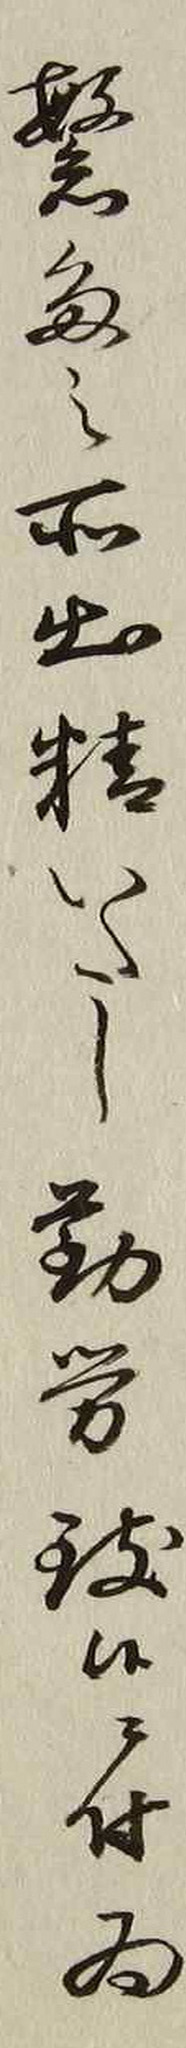繁多之所出精いたし勤労致候ニ付ゐ
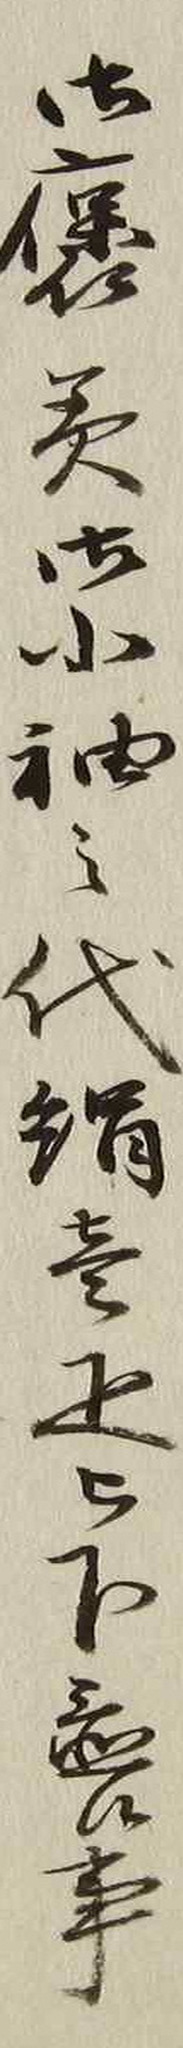御褒美御小袖之代絹壱疋迄下置候事
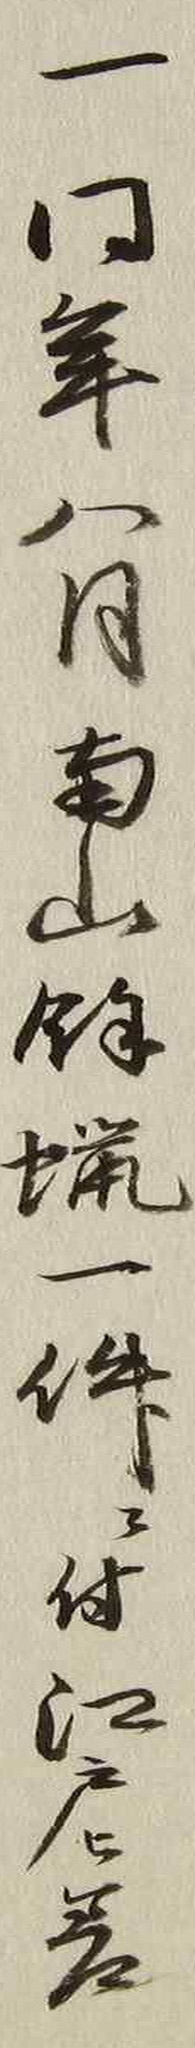一同年八月南山余蝋一件候ニ付江戸ニ差
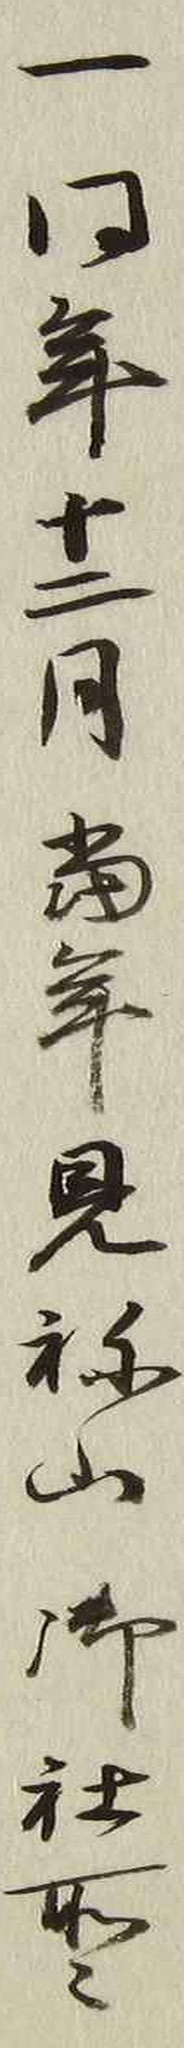一同年十二月当年見祢山御社所々
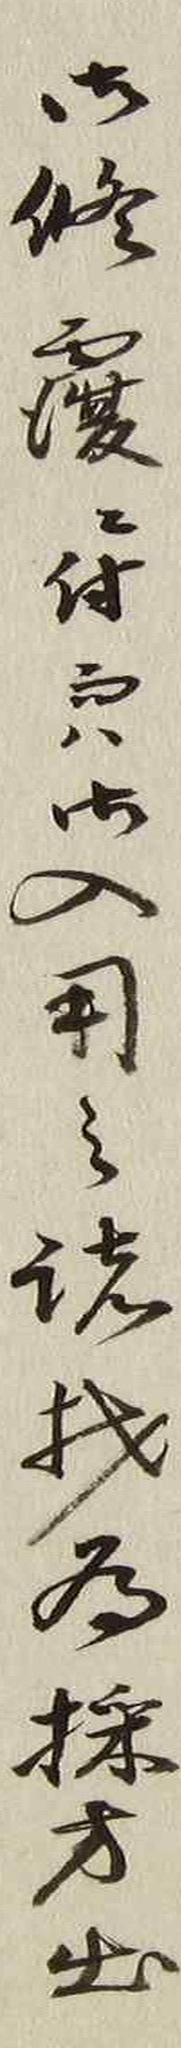御修覆に付而は御入用み諸材為採方出
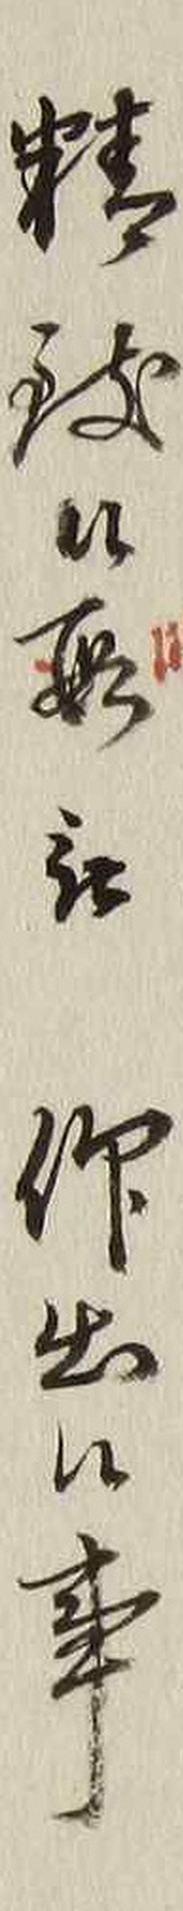精致候形取仰出候事
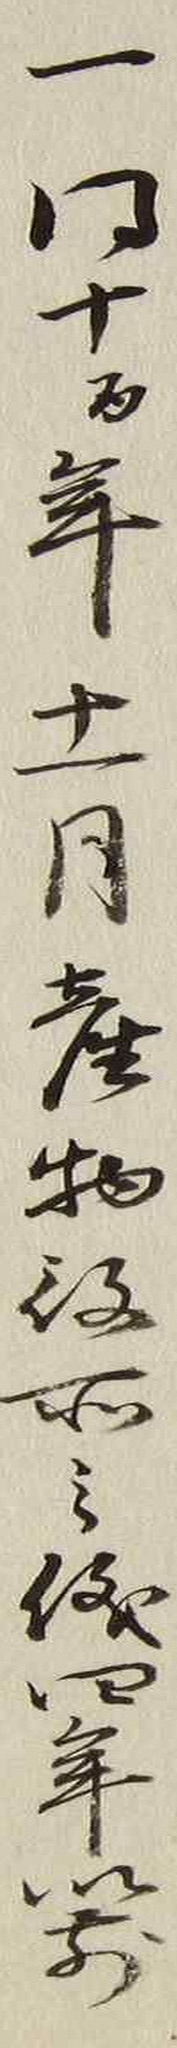一同十酉年年十月一産物後所之儀四年以前
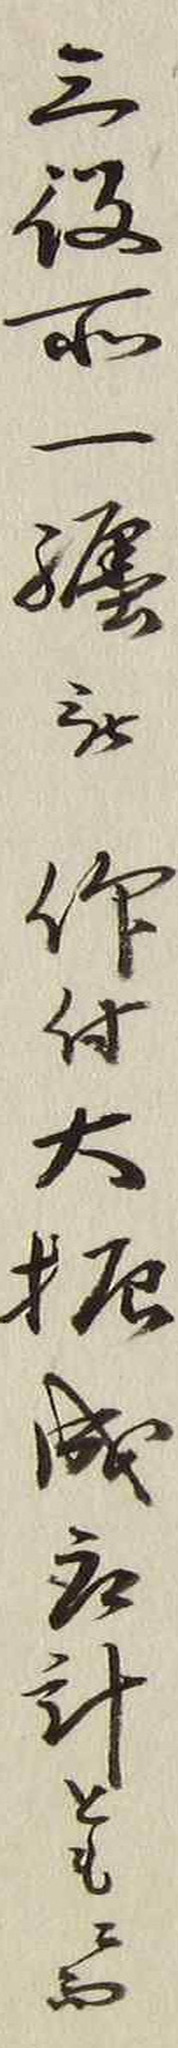三役所一⬜︎取仰付大振成取計ともニて
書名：諸士系譜　巻之160　な之部2
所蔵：会津若松市立会津図書館
